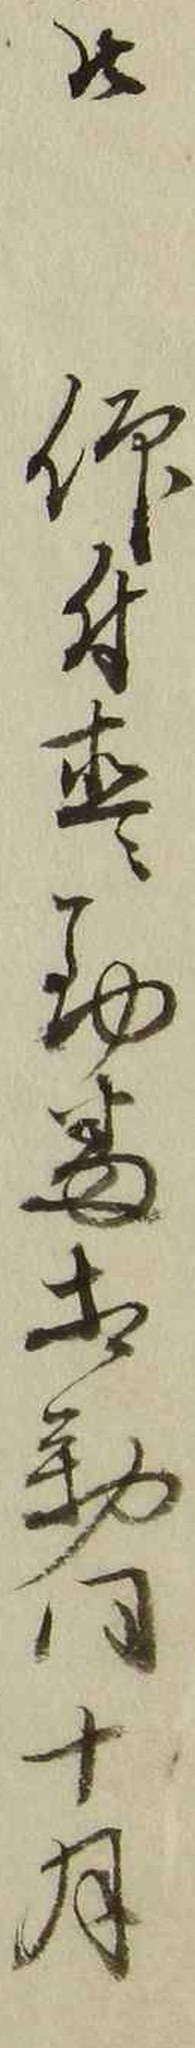被仰付直ニ勤番相勤同十月
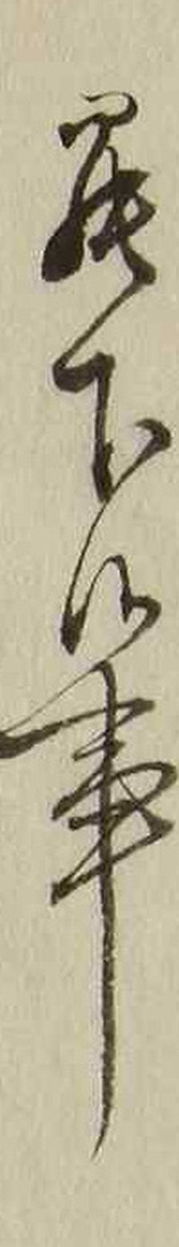罷下候事
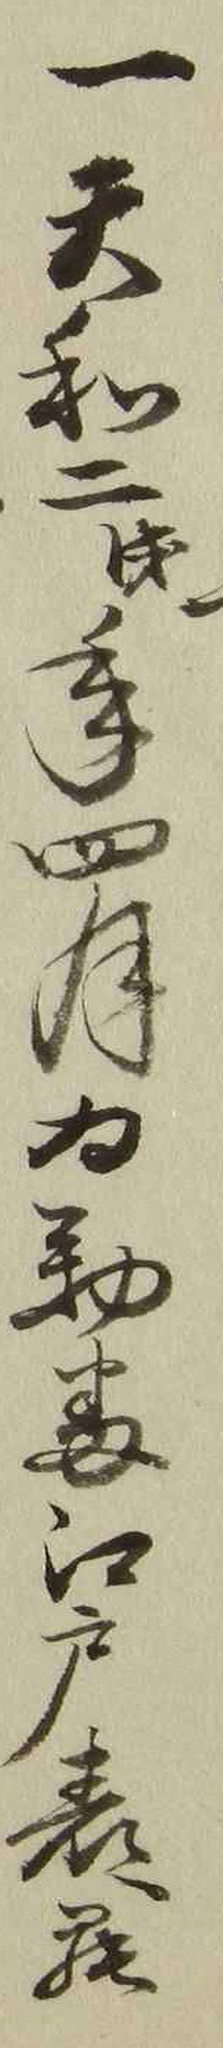一天和二戌年四月為勤番江戸表へ罷
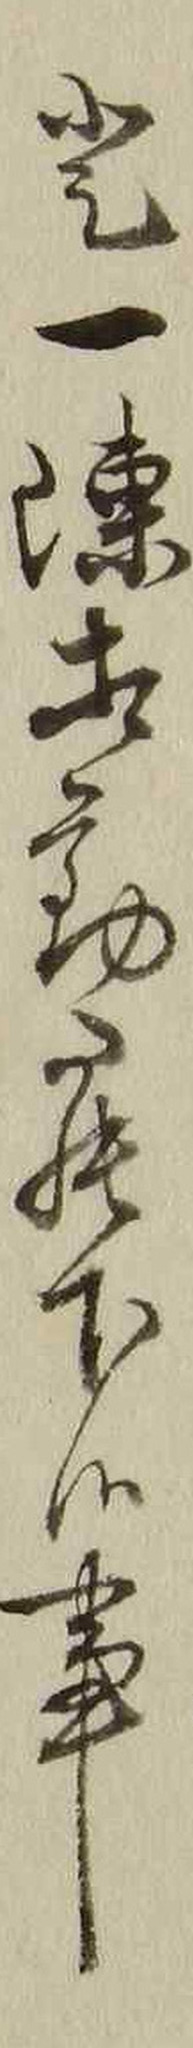登一陳相勤罷下候事
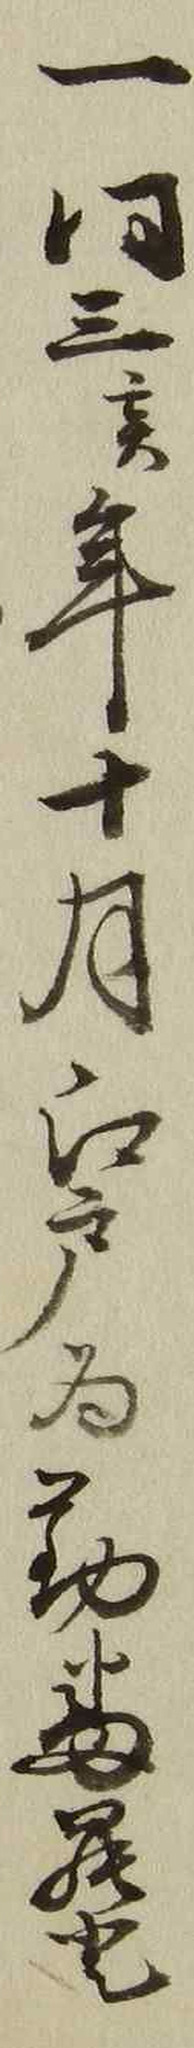一同三亥年十月江戸為勤番罷登
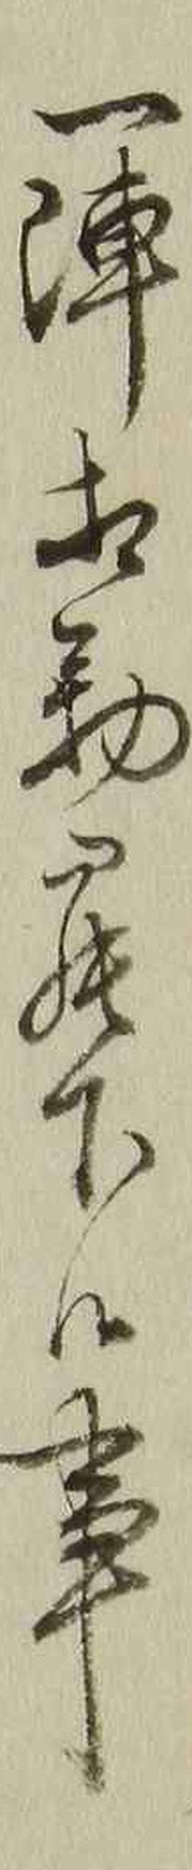一陣相勤罷下候事
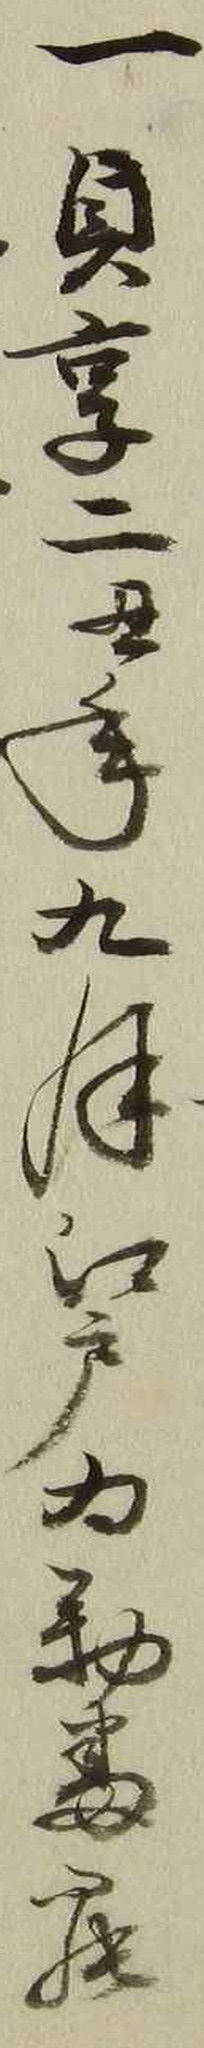一貞享二丑年九月江戸為勤番罷
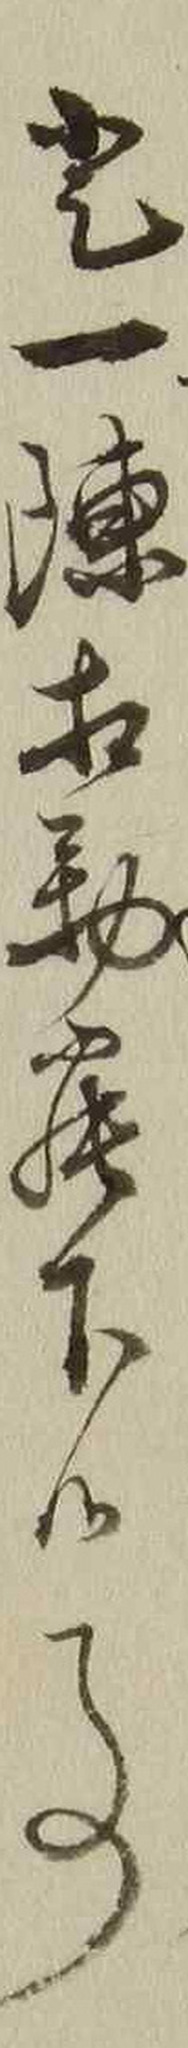登一陳相勤罷下候事
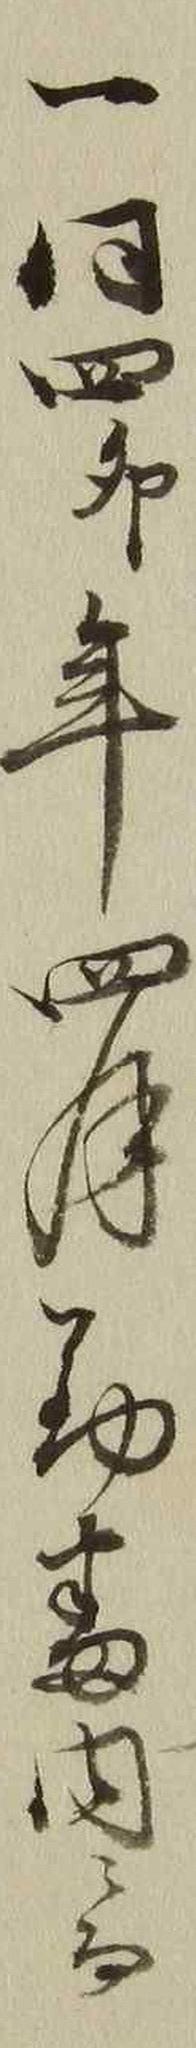一同四卯年四月勤番内ニ而
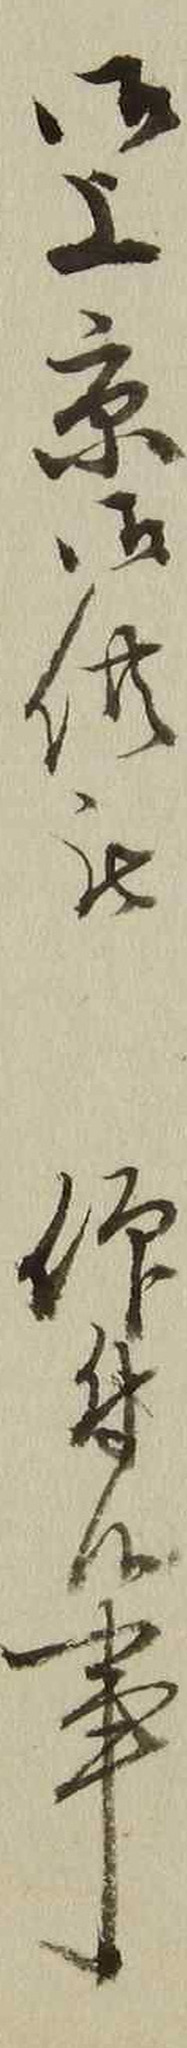御上京御供被仰付候事
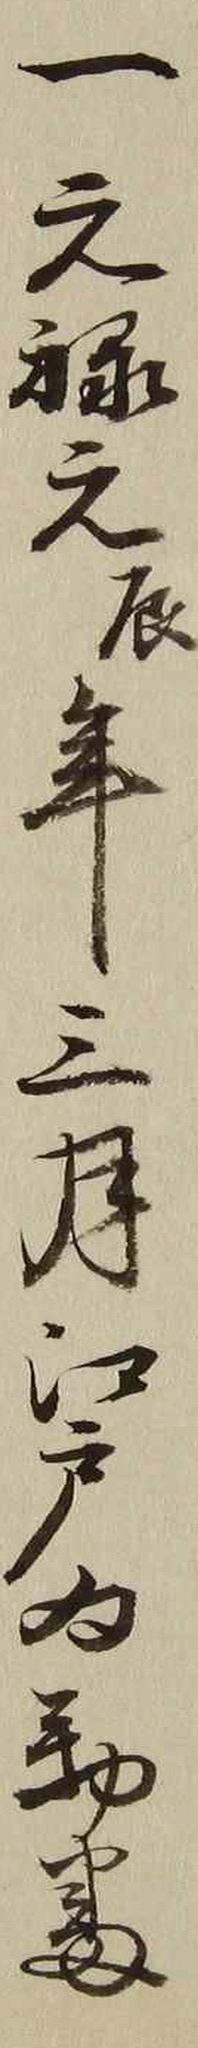一元禄元辰年三月江戸為勤番
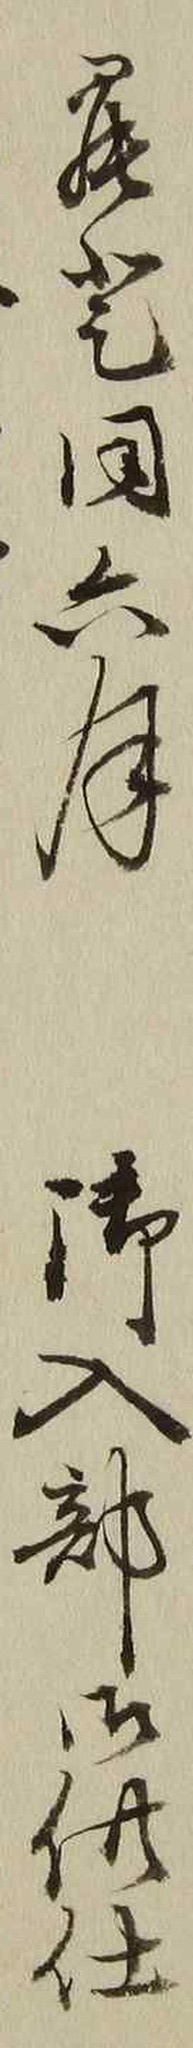罷登同六月御入部御供仕
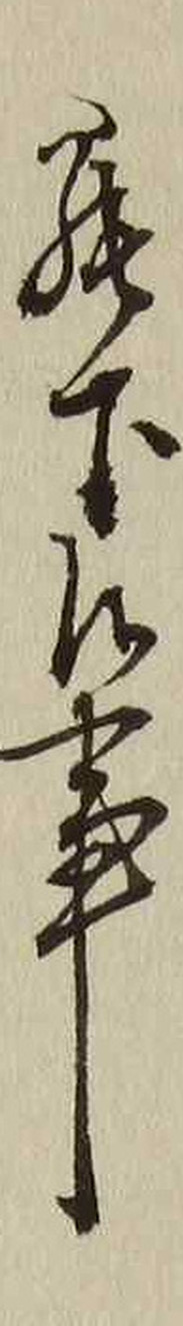罷下候事
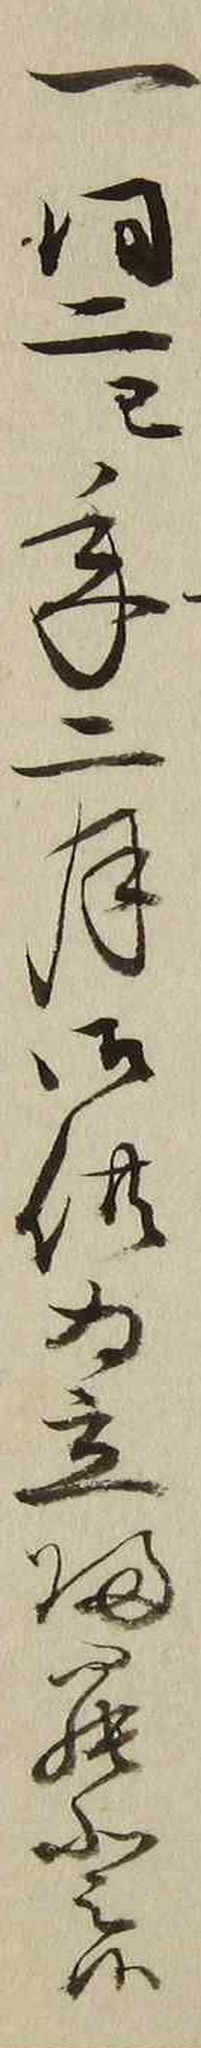一同二巳年二月御供為立帰罷登候
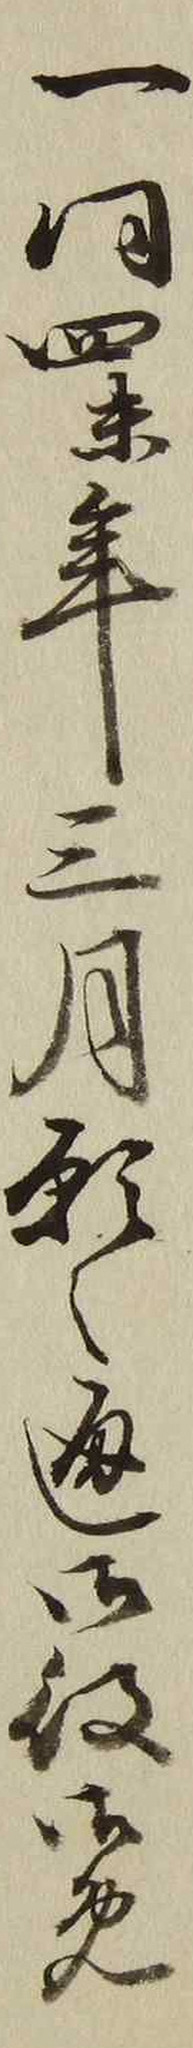一同四未年三月願之通御役御免
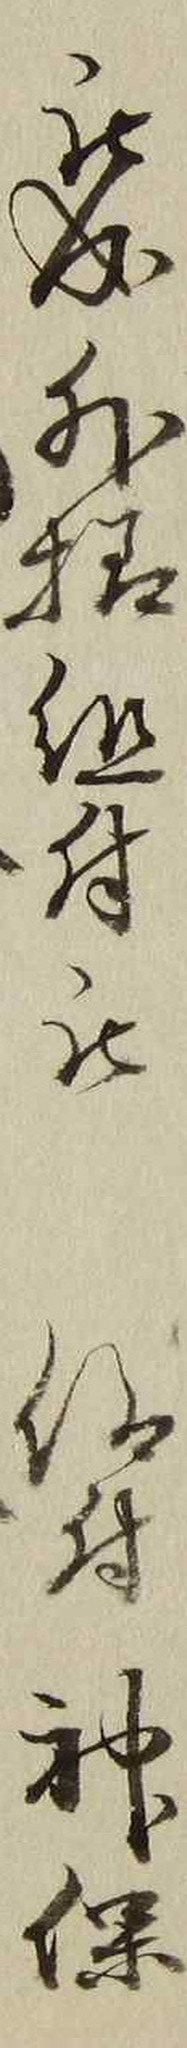被成外様組付被仰付神保
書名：諸士系譜　巻之36　は之部4
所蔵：会津若松市立会津図書館
